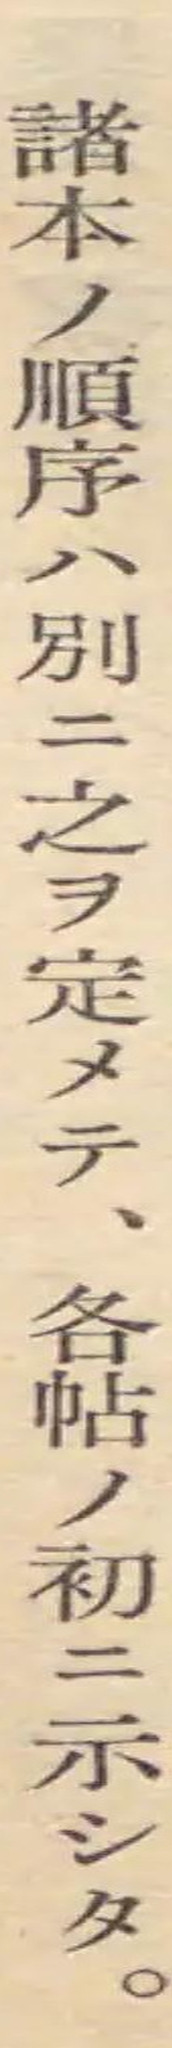諸本ノ順序ハ別ニ之ヲ定メテ、各帖ノ初ニ示シタ。
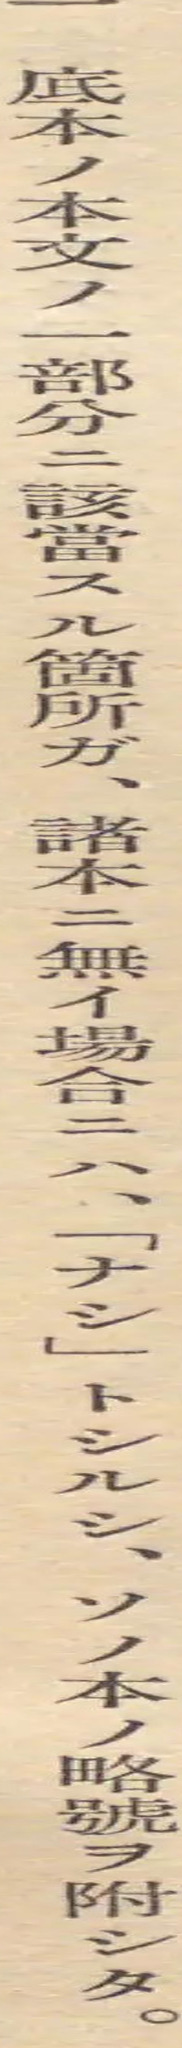一底本ノ本文ノ一部分ニ該当スル箇所ガ、諸本ニ無イ場合ニハ、「ナシ」トシルシ、ソノ本ノ略号ヲ附シタ。
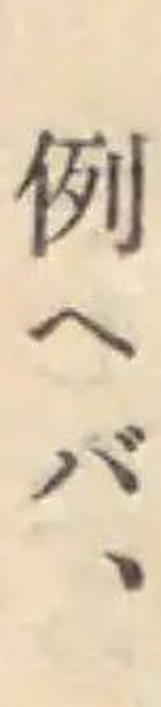例ヘバ、
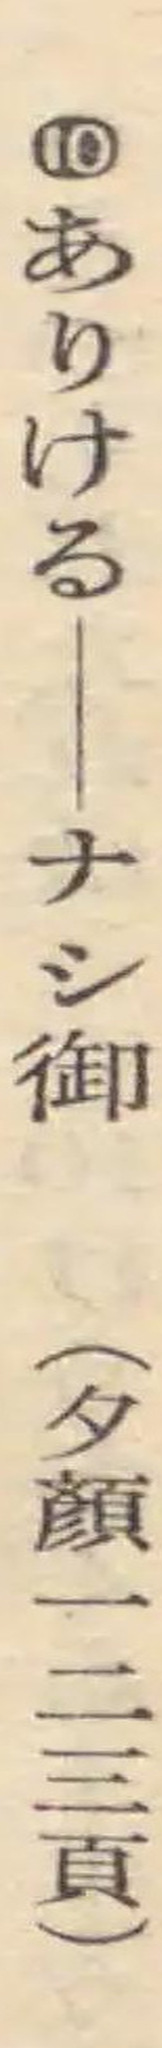❿ありける──ナシ御(夕顔一二三頁)
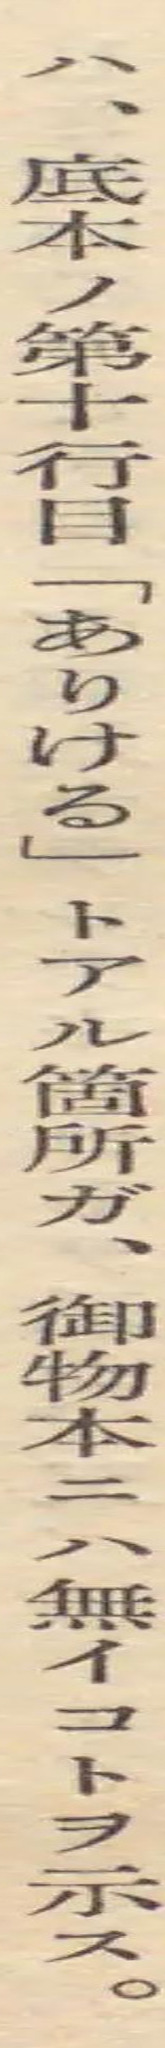ハ、底本ノ第十行目「ありける」トアル箇所ガ、御物本ニハ無イコトヲ示ス。
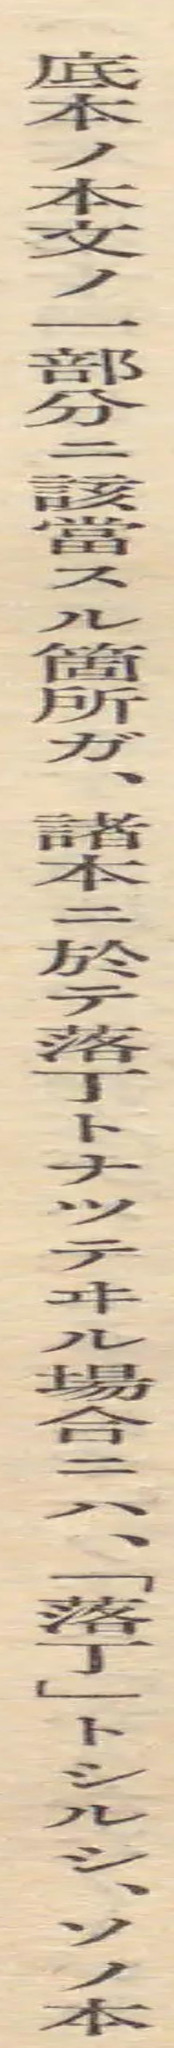一底本ノ本文ノ一部分ニ該当スル箇所ガ、諸本ニ於テ落丁トナツテヰル場合ニハ、「落丁」トシルシ、ソノ本
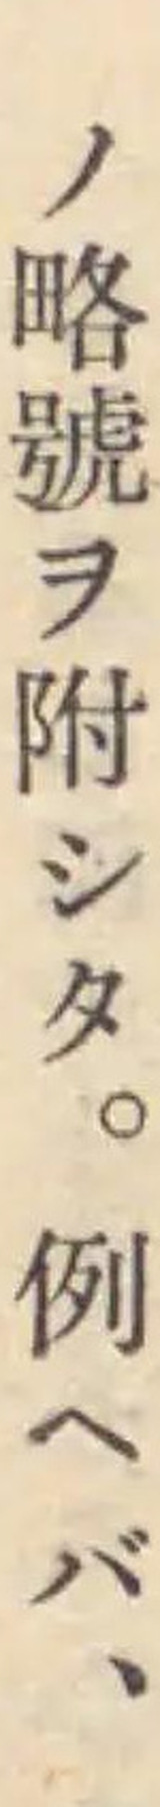ノ略号ヲ附シタ。例ヘバ、
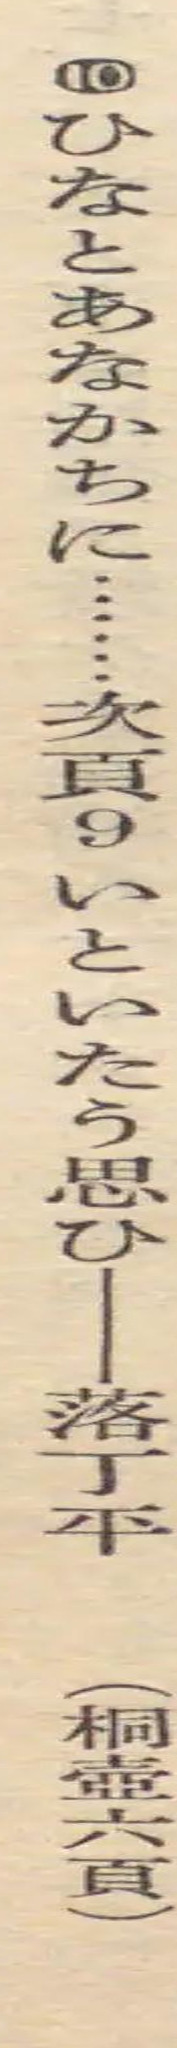❿ひなとあなかちに……次頁９いといたう思ひ──落丁平(桐壺六頁)
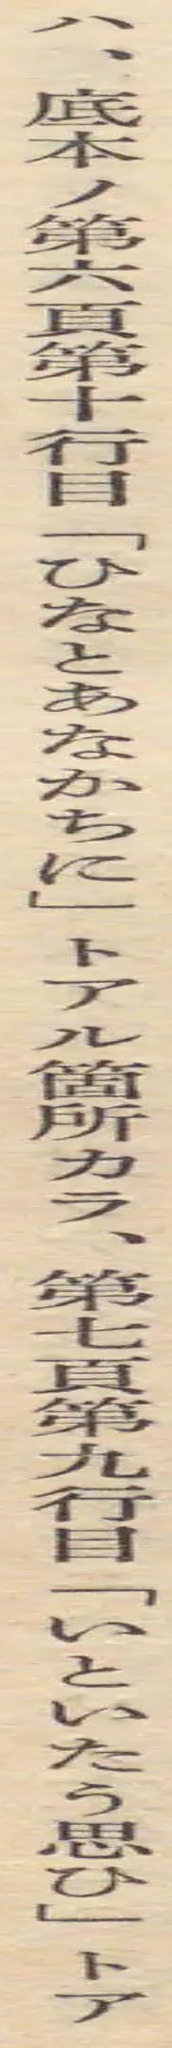ハ、底本ノ第六頁第十行目「ひなとあなかちに」トアル箇所カラ、第七頁第九行目「いといたう思ひ」トア
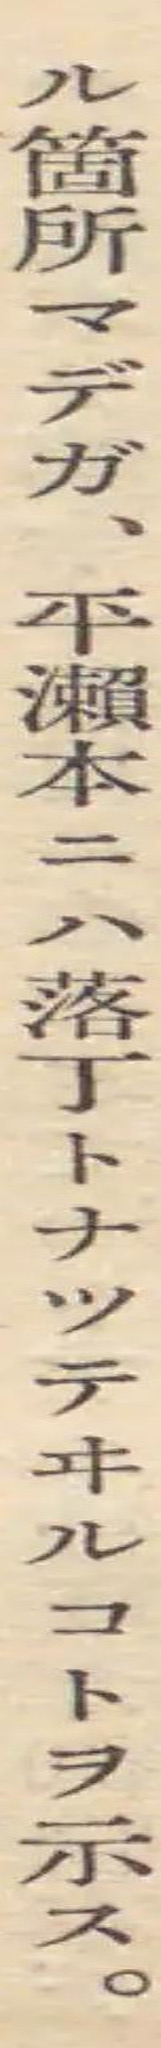ル箇所マデガ、平瀬本ニハ落丁トナツテヰルコトヲ示ス。
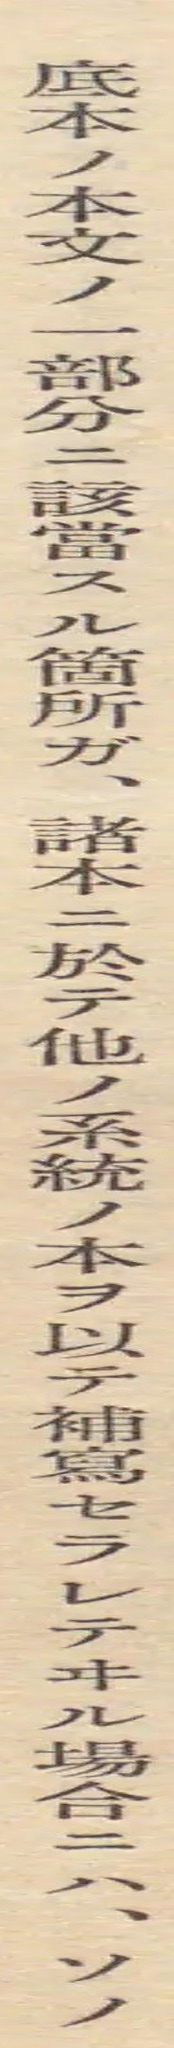一底本ノ本文ノ一部分ニ該当スル箇所ガ、諸本ニ於テ他ノ系統ノ本ヲ以テ補写セラレテヰル場合ニハ、ソノ
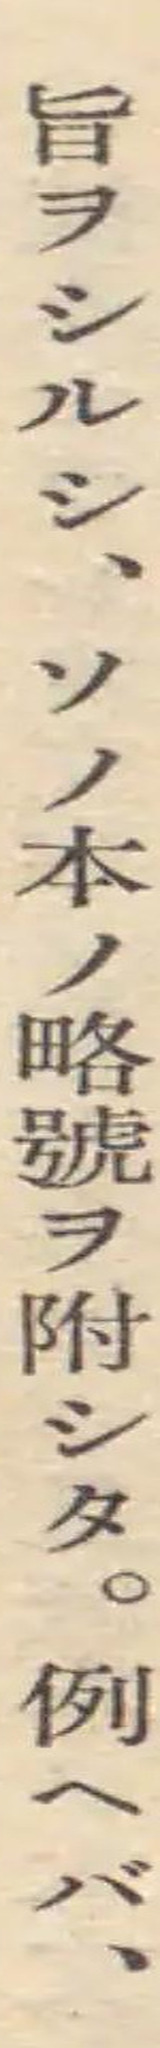旨ヲシルシ、ソノ本ノ略号ヲ附シタ。例ヘバ、
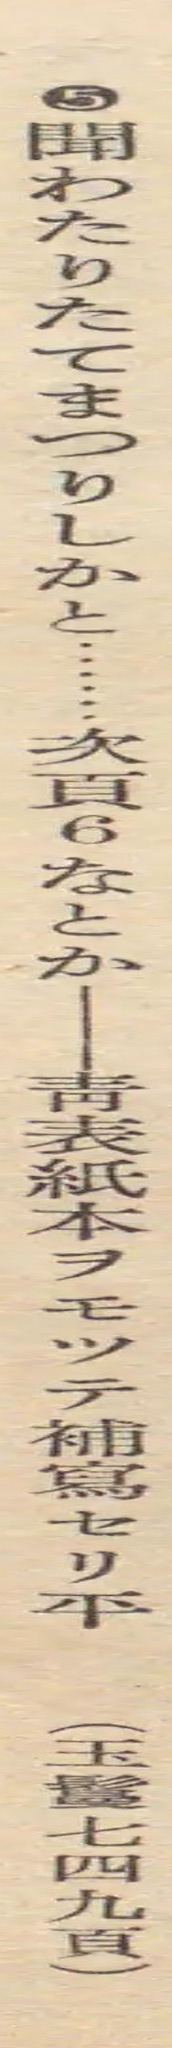❺聞わたりたてまつりしかと……次頁６なとか──青表紙本ヲモツテ補写セリ平(玉鬘七四九頁)
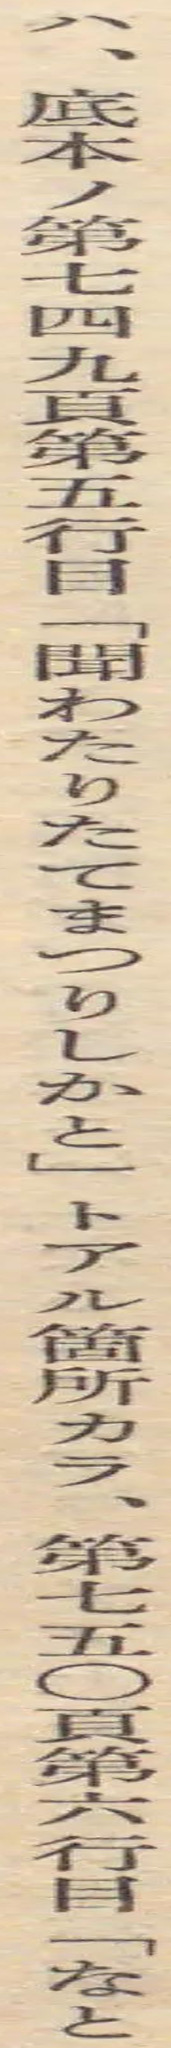ハ、底本ノ第七四九頁第五行目「聞わたりたてまつりしかと」トアル箇所カラ、第七五〇頁第六行目「なと
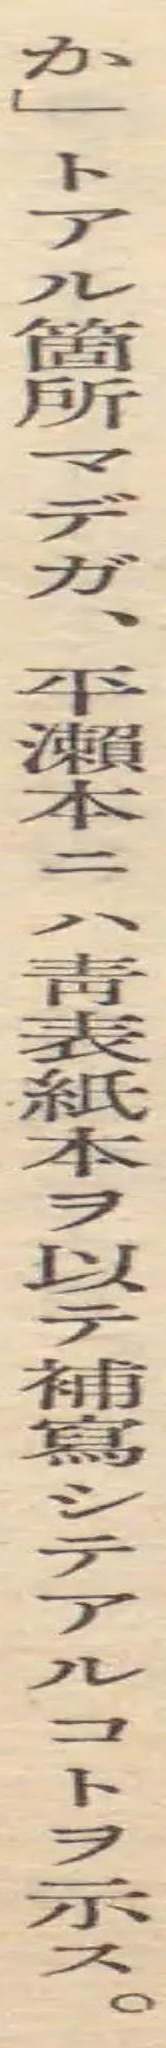か」トアル箇所マデガ、平瀬本ニハ青表紙本ヲ以テ補写シテアルコトヲ示ス。
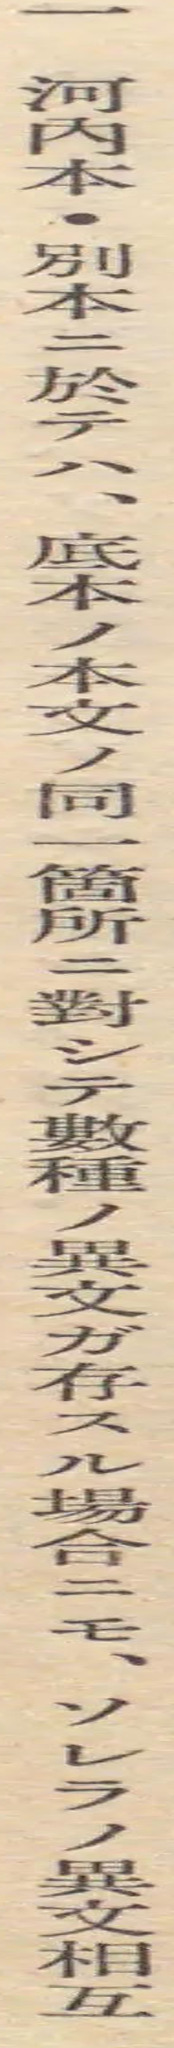一河内本・別本ニ於テハ、底本ノ本文ノ同一箇所ニ対シテ数種ノ異文ガ在スル場合ニモ、ソレラノ異文相互
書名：校異源氏物語.
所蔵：国立国会図書館 National Diet Library, JAPAN
